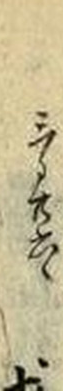三月廿六日
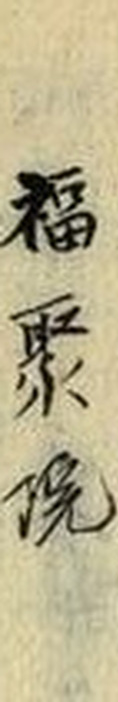福聚院
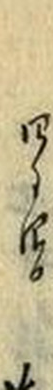四月四日
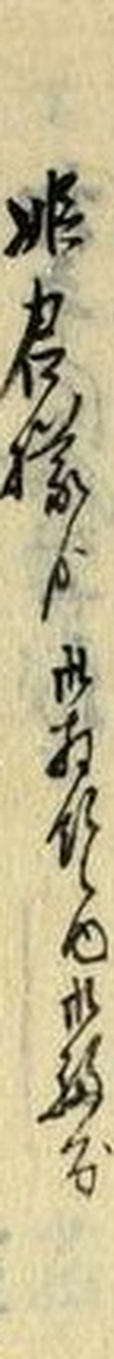姫君様ゟ御拝領之内御移分
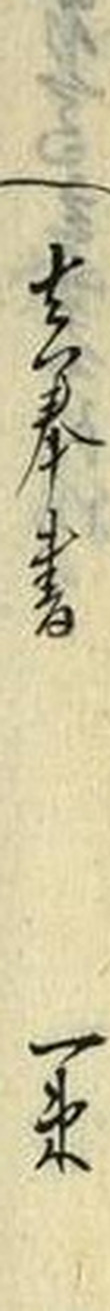真奉書一束
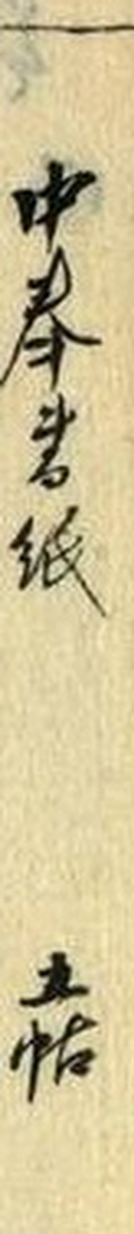中奉書紙五帖
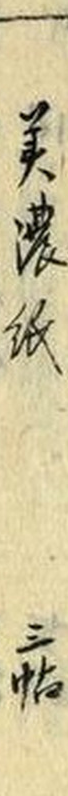美濃紙三帖
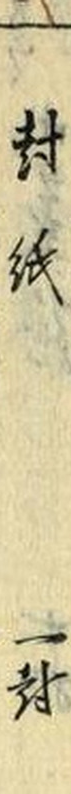封紙一封
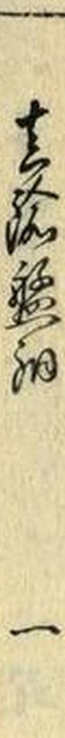真鍮盤網一
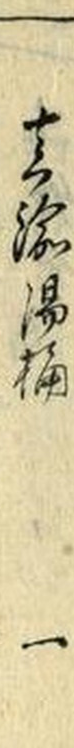真鍮湯桶一
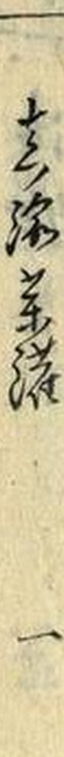真鍮薬罐一
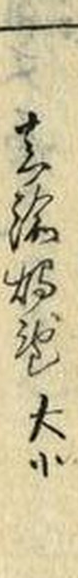真鍮燭台大小二
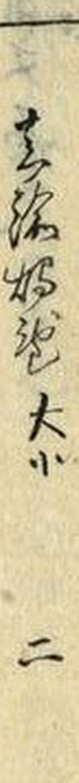真鍮燭台大小二
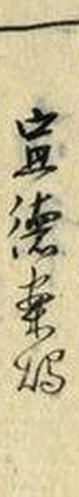宣徳案燭一
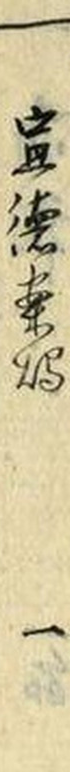宣徳案燭一
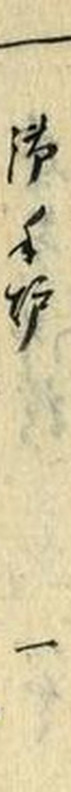御手炉一
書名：少傅日録抄（斉承付側向頭取日記、在府）
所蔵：福井県文書館 Fukui Prefectural Archives
